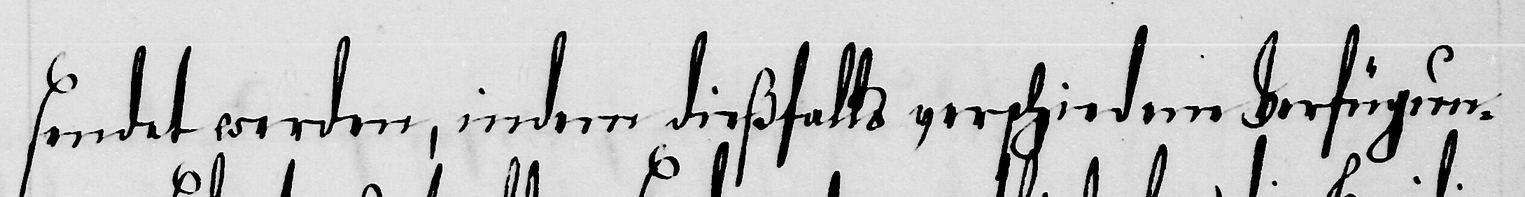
sendet werden, indem dießfalls verschiedene Verfügun¬
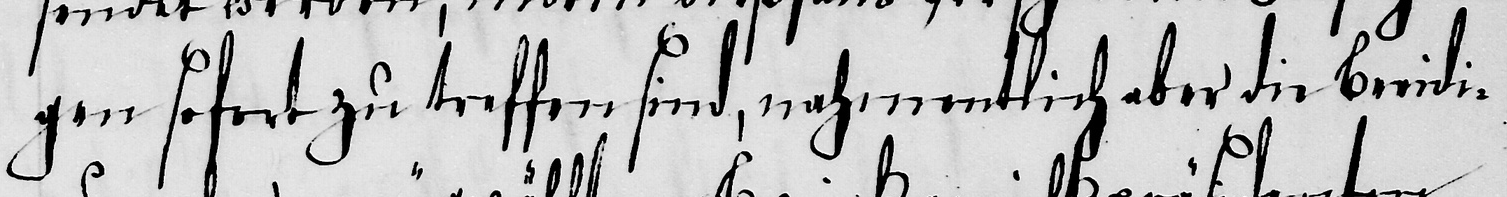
gen sofort zu treffen sind, nahmentlich aber die Beeidi¬
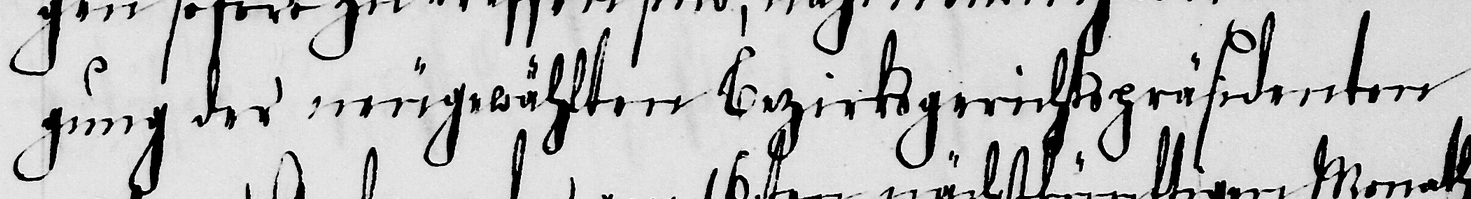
gung der neugewählten Bezirksgerichtspräsidenten
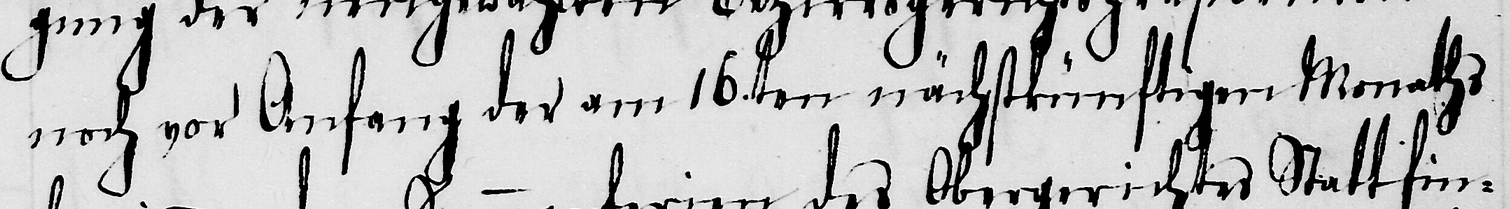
noch vor Anfang der am 16.ten nächstkünftigen Monaths
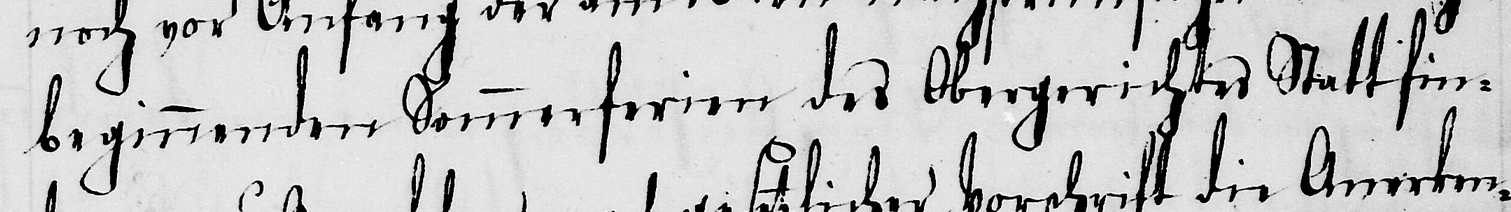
beginnenden Sommerferien des Obergerichtes Statt fin¬
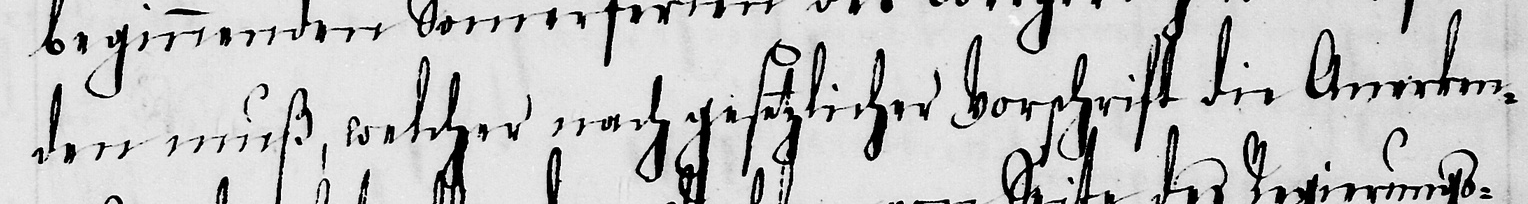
den muß, welcher nach gesetzlicher Vorschrift die Anerken¬
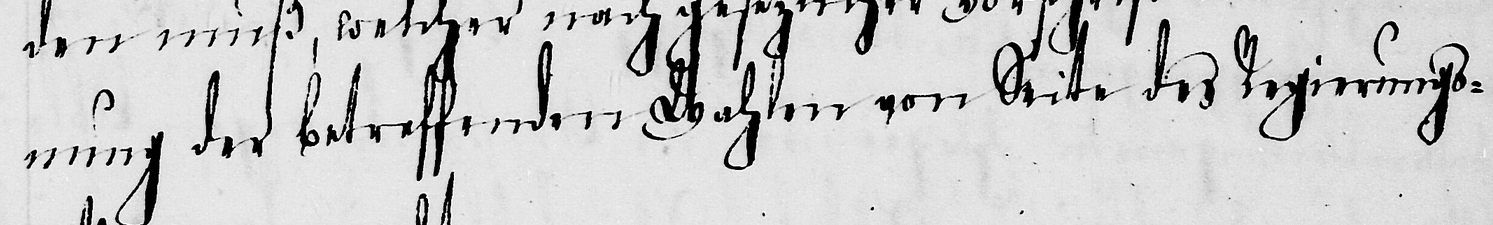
nung der betreffenden Wahlen von Seite des Regierungs¬
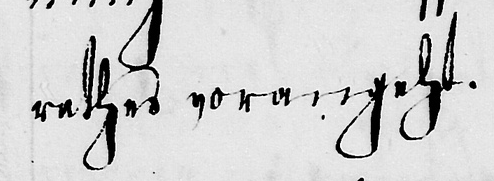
rathes vorangeht.
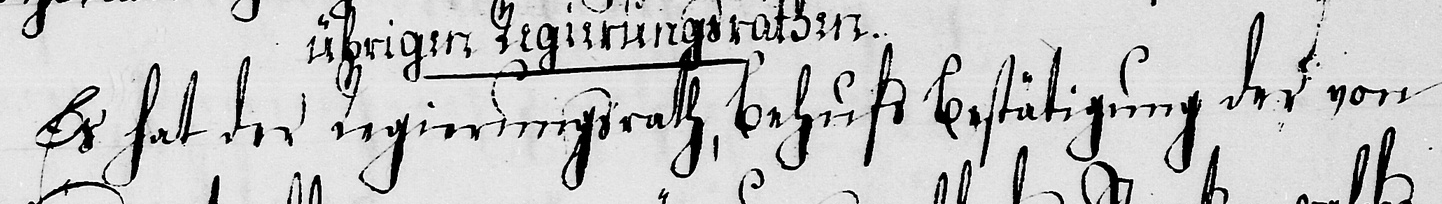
Es hat der Regierungsrath, Behufs Bestätigung der von
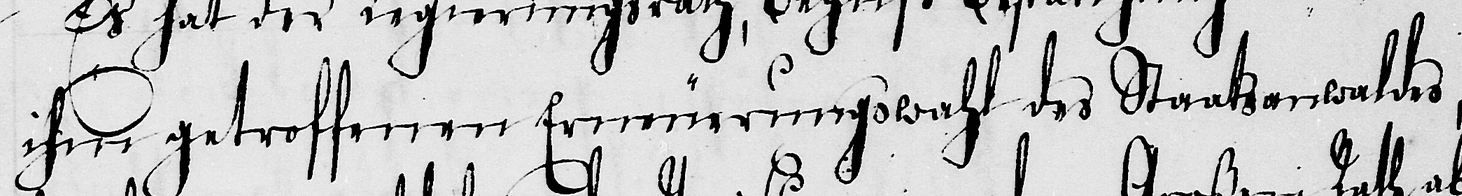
ihm getroffenen Erneuerungswahl des Staatsanwaldes,
